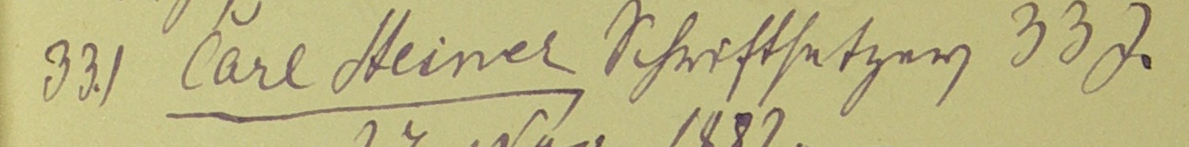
33.) Carl Heiner, Schriftsetzer, 33 J.
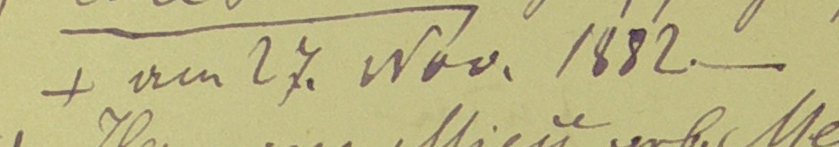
am 27 Nov. 82
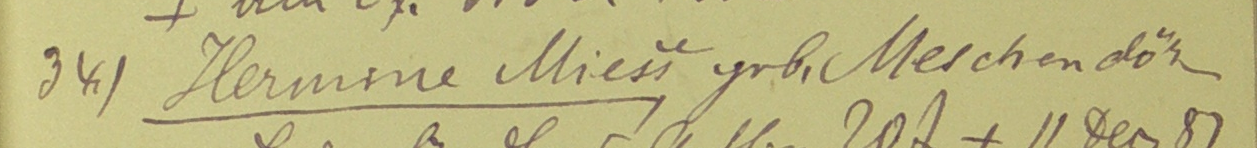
34.) Hermine Miess, geb. Meschendör¬
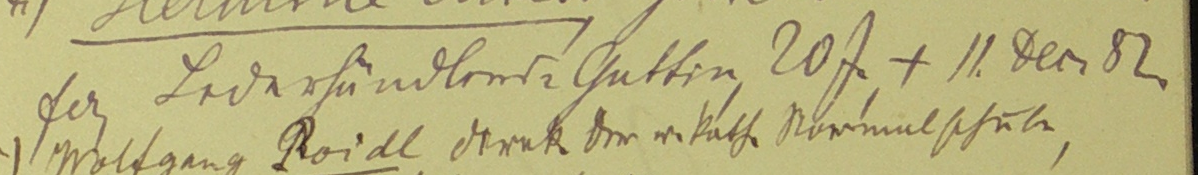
fer, Lederhändler Gattin, 20 J. am 11 Dec. 82
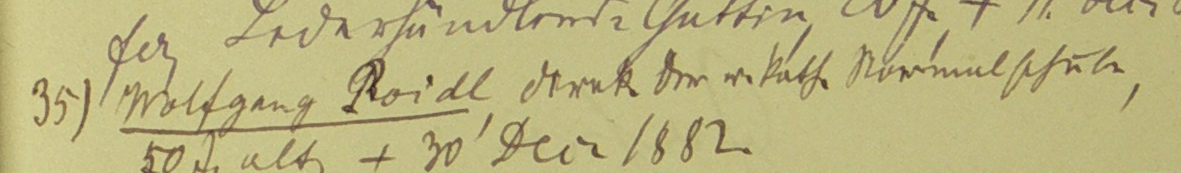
35.) Wolfgang Roidl, Direkto der katholischen Normalschule,
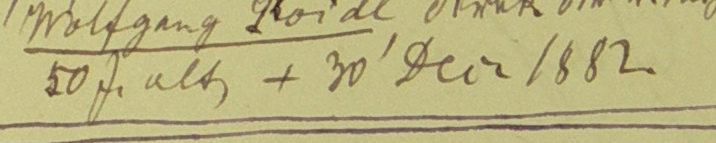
50 J. alt am 30 Dec. 82
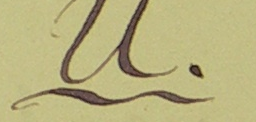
U
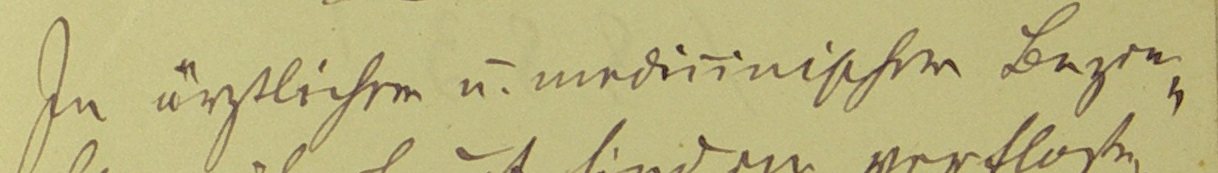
In ärztlicher und medizinischer Bezie¬
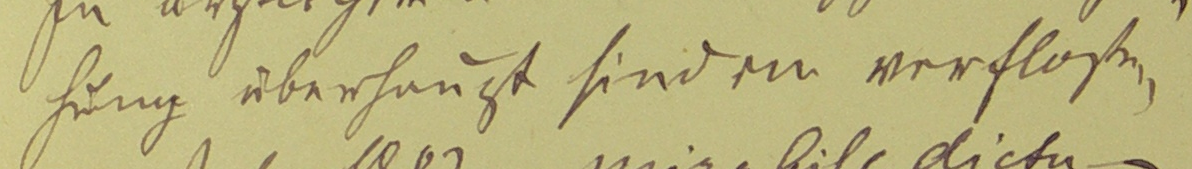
hung überhaupt sind im vergange¬
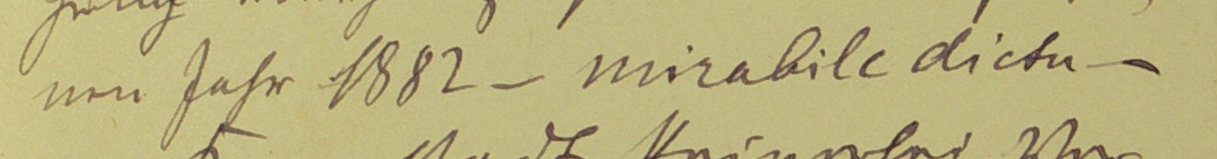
nen Jahr 1882 –mirabile dictu¬
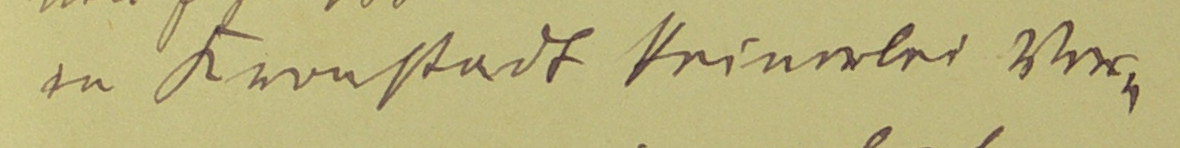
in Kronstadt keinerlei Ver¬
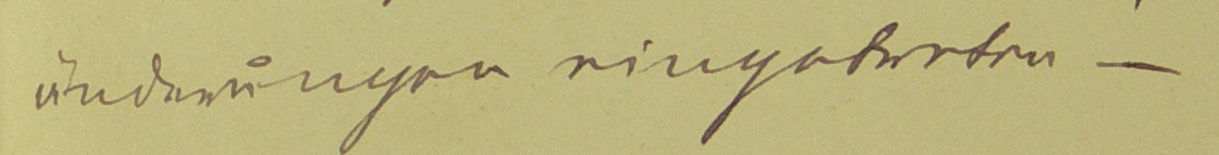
änderungen eingetreten—
